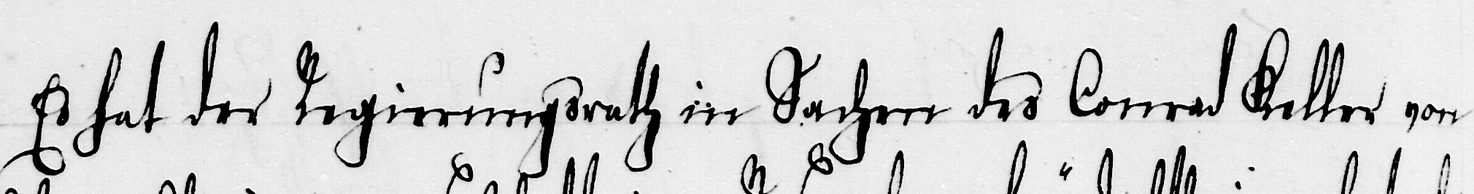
Es hat der Regierungsrath in Sachen des Conrad Keller
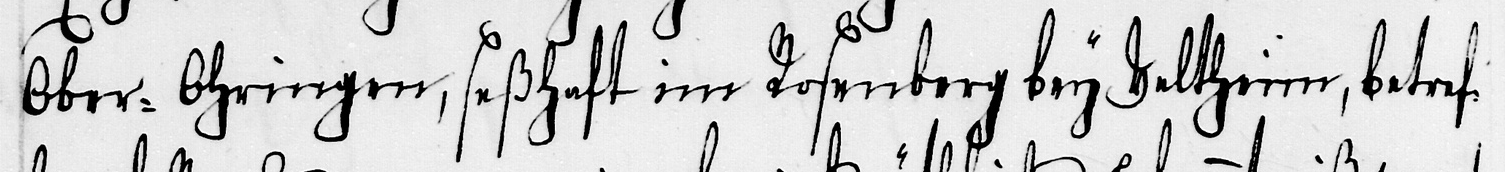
Ober-Ohringen, seßhaft im Rosenberg bey Veltheim, betref¬
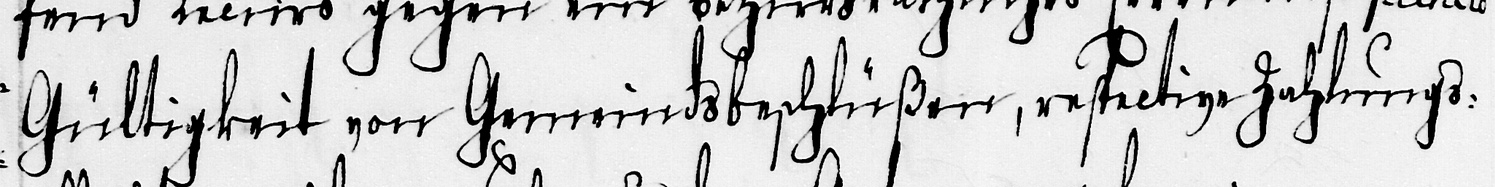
Gültigkeit von Gemeindsbeschlüßen, respective Zahlungs¬
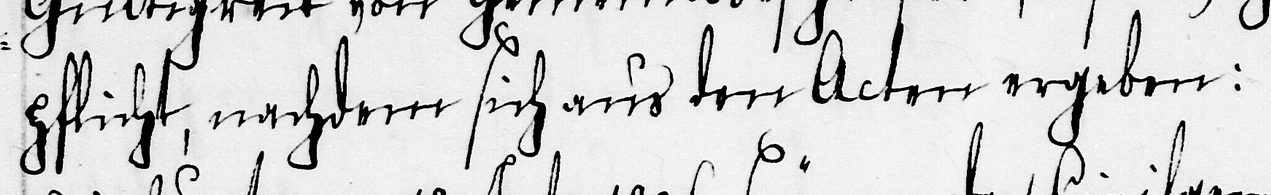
pflicht, nachdem sich aus den Acten ergeben:
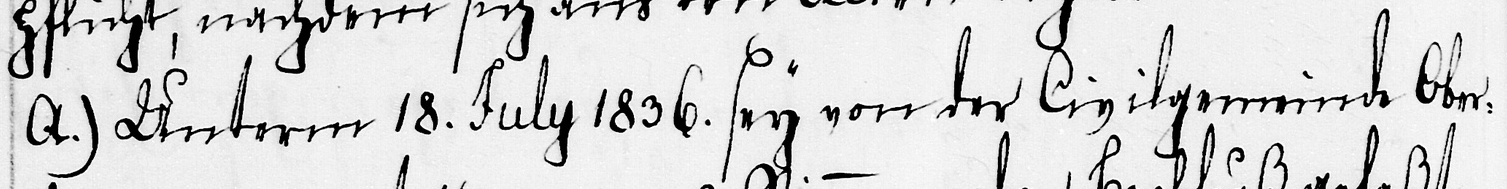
A.) Unterm 18. July 1836. sey von der Civilgemeinde Ober¬
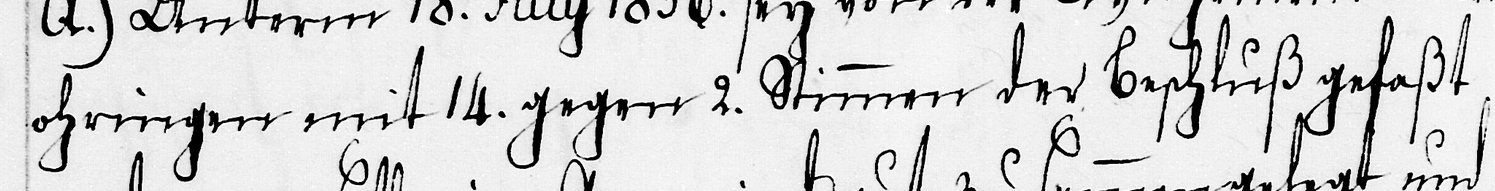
ohringen mit 14. gegen 2. Stimmen der Beschluß gefaßt
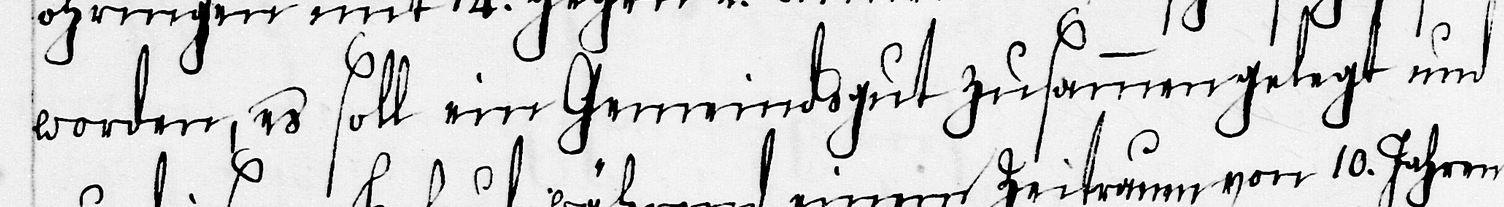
worden, es soll ein Gemeindsgut zusammengelegt und
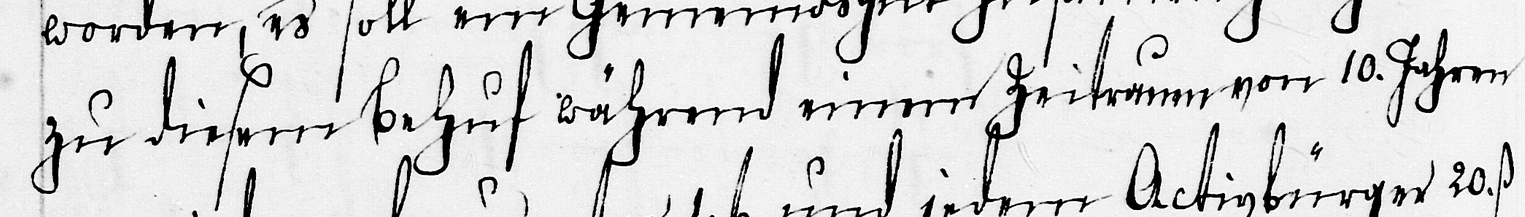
zu diesem Behuf während einem Zeitraum von 10. Jahren
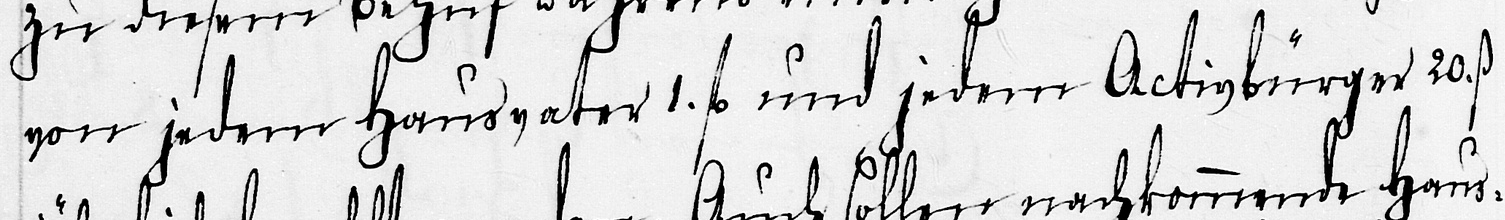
von jedem Hausvater 1. fl. und jedem Activbürger 20.
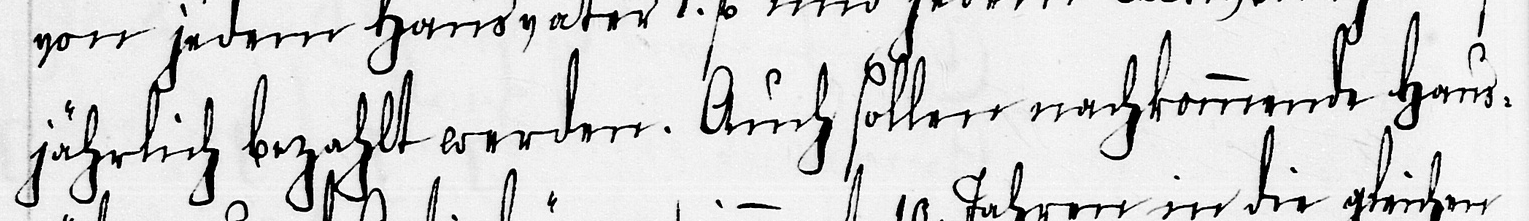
jährlich bezahlt werden. Auch sollen nachkommende Haus¬
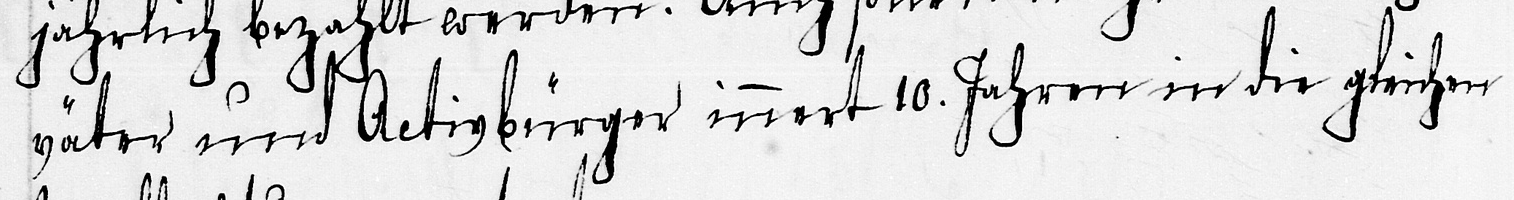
väter und Activbürger innert 10. Jahren in die gleichen
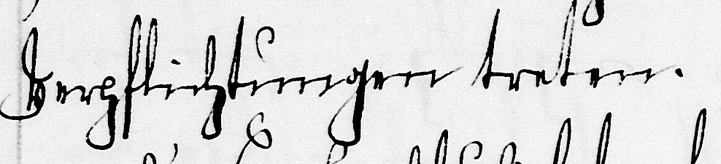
Verpflichtungen treten.
